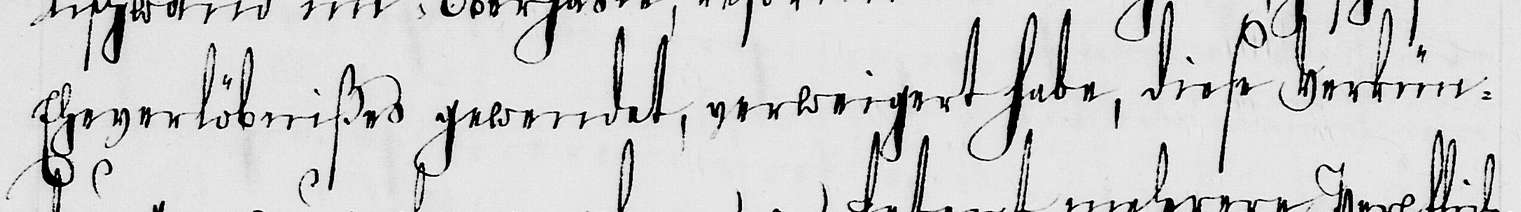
Eheverlöbnißes gewendet, verweigert habe, diese Verkündi¬
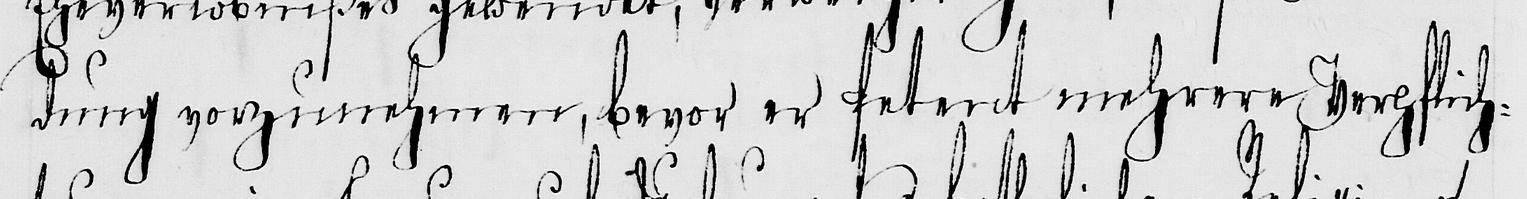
gung vorzunehmen, bevor er Petent mehrere Verpflich¬
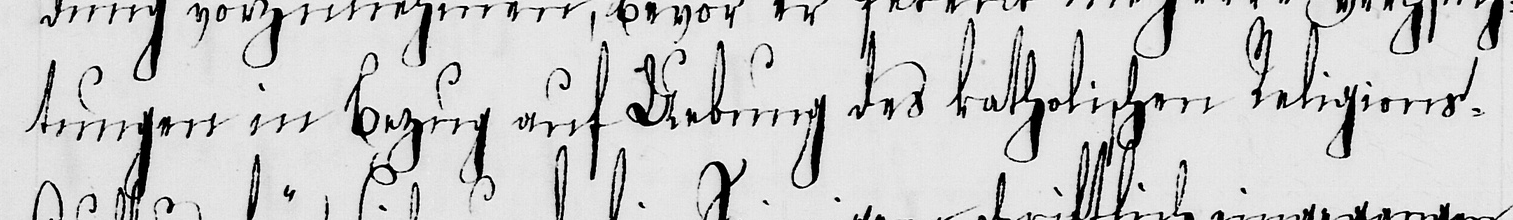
tungen in Bezug auf Uebung des katholischen Religion¬
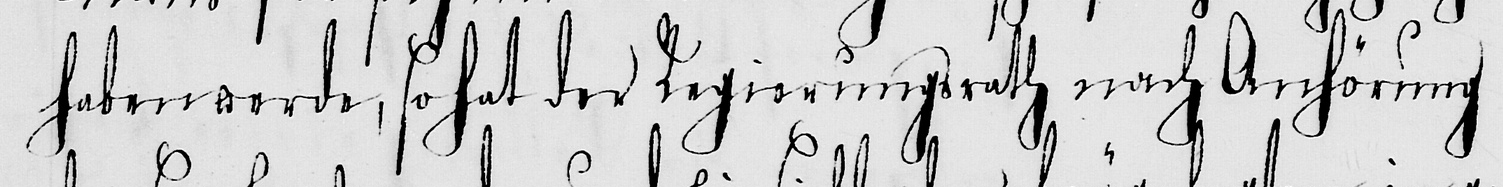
haben werde, so hat der Regierungsrath nach Anhörung
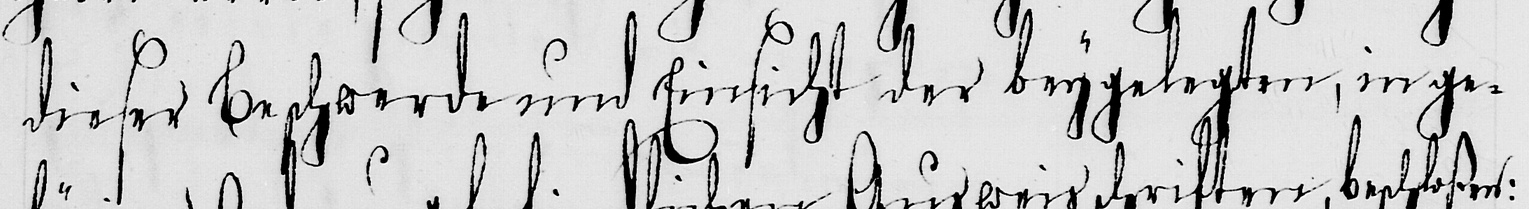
dieser Beschwerde und Einsicht der beygelegten, in ge¬
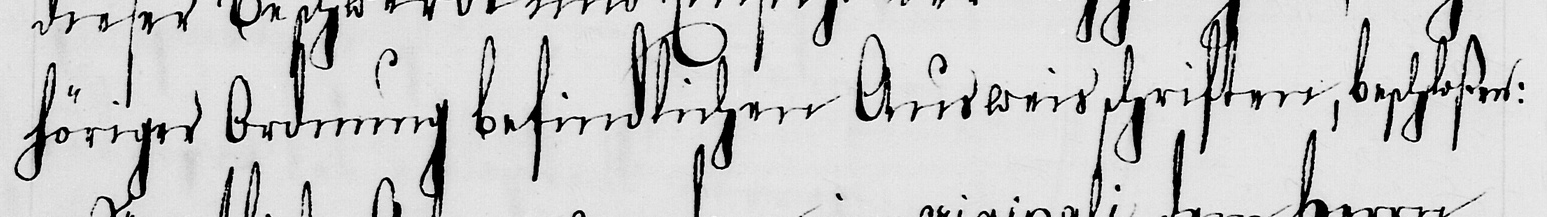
höriger Ordnung befindlichen Ausweisschriften, beschloß¬
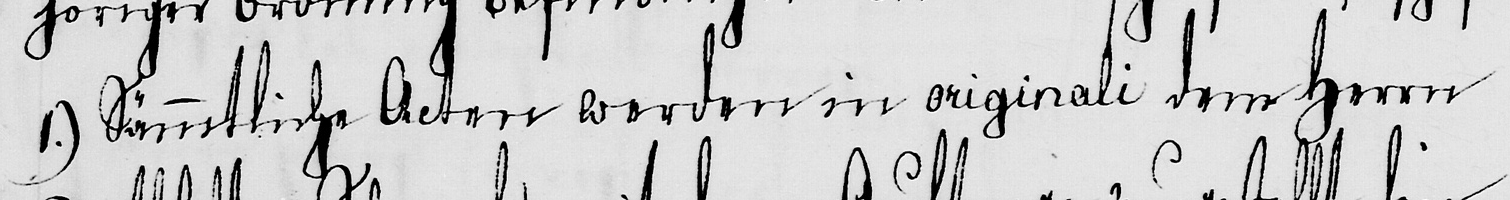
1.) Sämmtliche Acten werden in originali dem Herrn
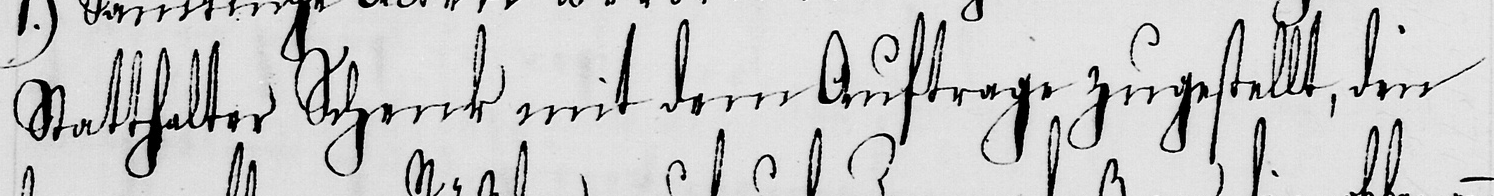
Statthalter Schenk mit dem Auftrage zugestellt, den
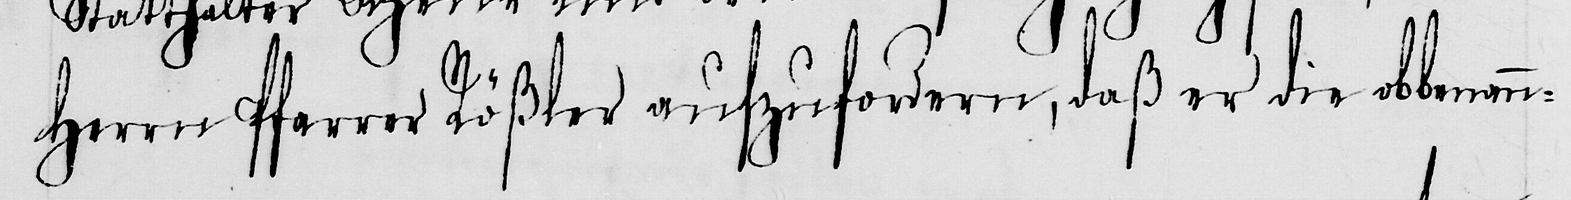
Herrn Pfarrer Rößler aufzufordern, daß er die obbenan¬
